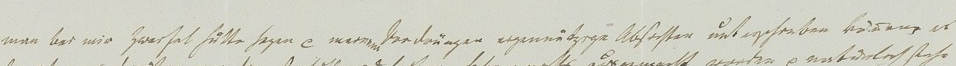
man bei mir Zweifel hätte hegen & meinem Vordrängen eigennützige Absichten unterschieben können, es
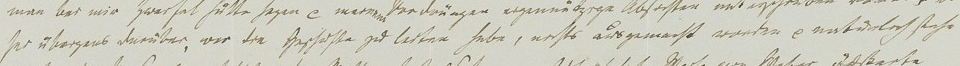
sei übrigens darüber, wer die Geschäfte zu leiten habe, nichts ausgemacht worden & natürlich stehe
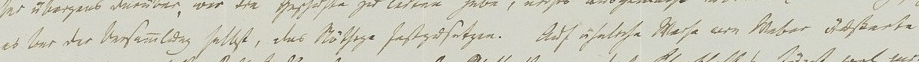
es bei der Versammlung selbst, das Nöthige festzusetzen. Auf ähnliche Weise wie Weber äußerte
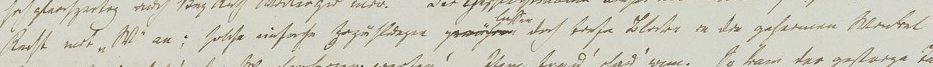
Recht mit «W» an; solche einfache Erzählungen gewährenlassen doch tiefe Blicke in die geheimen Winkel
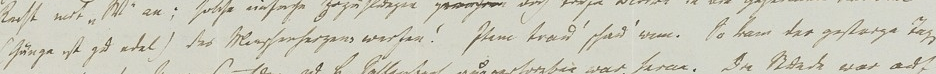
(Gänge ist zu edel) des Menschenherzens werfen! Item trau' schau' wem. So kam der gestrige Tag,
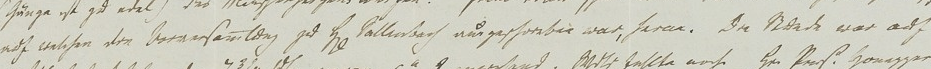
auf welchen die Vorversammlung zu Herrn Sallenbach ausgeschrieben war, heran. Die Stunde war auf
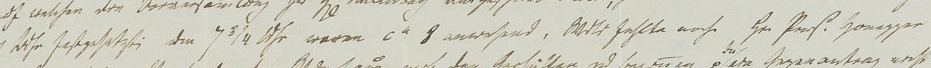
Uhr festgesetzt; um 7 ¾ Uhr waren ca 8 anwesend, Wdli fehlte noch. Hr Präs. Honegger
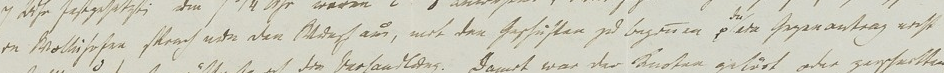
in Wollishofen sprach nun den Wunsch aus, mit den Geschäften zu beginnen & da ein Gegenantrag nicht
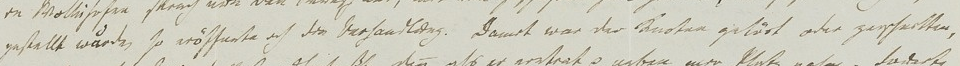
gestellt wurde, so eröffnete ich die Versammlung. Damit war der Knoten gelöst oder zerschnitten,
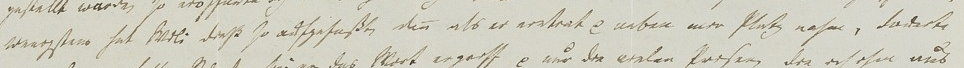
wenigstens hat Wdli dieß so aufgefaßt, denn als er eintrat & neben mir Platz nahm, dauerte
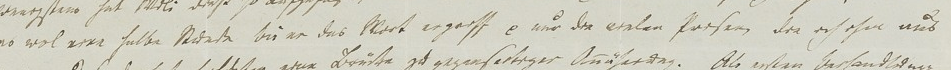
es wol eine halbe Stunde bis er das Wort ergriff & nur die vielen Prisen, die ich ihm aus
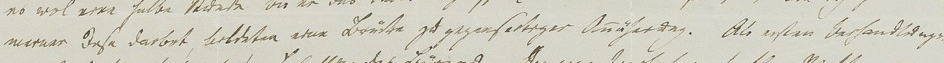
meiner Dose darbot, bildeten eine Brücke zu gegenseitiger Annäherung. Als ersten Verhandlungs-
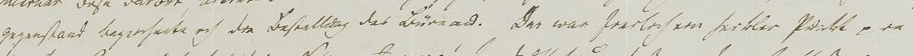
gegenstand bezeichnete ich die Bestellung des Büreau. Das war freilich ein heikler Punkt & in
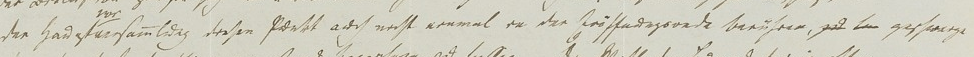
der Hauptvorversammlung diesen Punkt auch nicht einmal in der Eröffnungsrede berühren, ...... geschweige
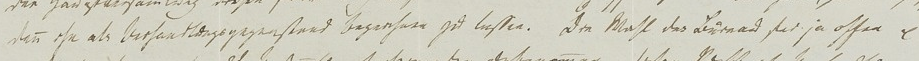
denn ihn als Verhandlungsgegenstand bezeichnen zu lassen. Die Wahl des Bureau sei ja offen &
